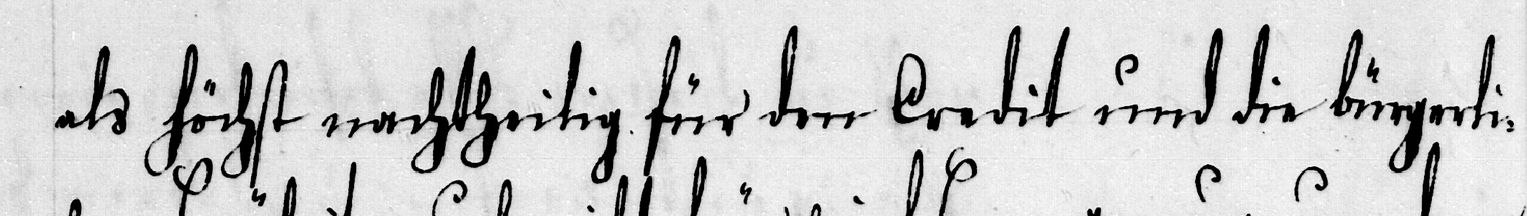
als höchst nachtheilig für den Credit und die bürgerl¬
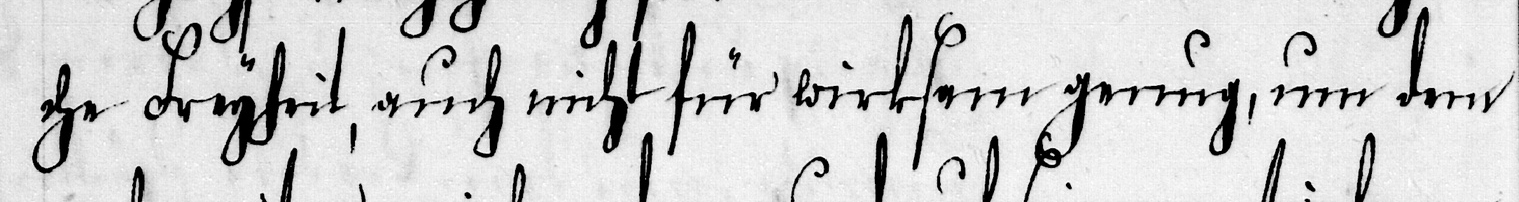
iche Freyheit, auch nicht für wirksam genug, um dem
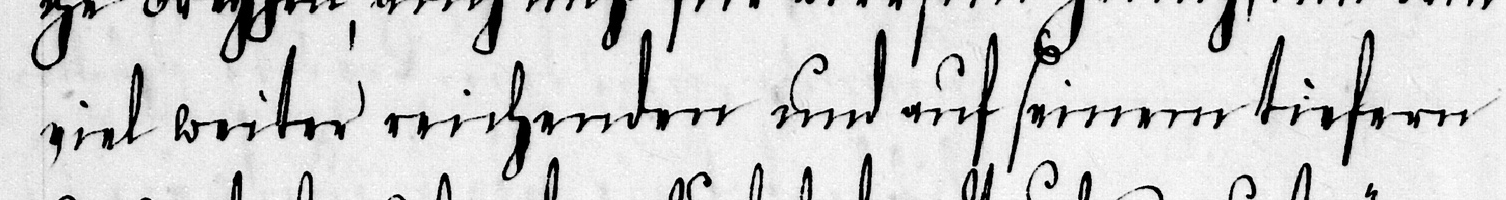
viel weiter reichenden und auf seinem tiefern
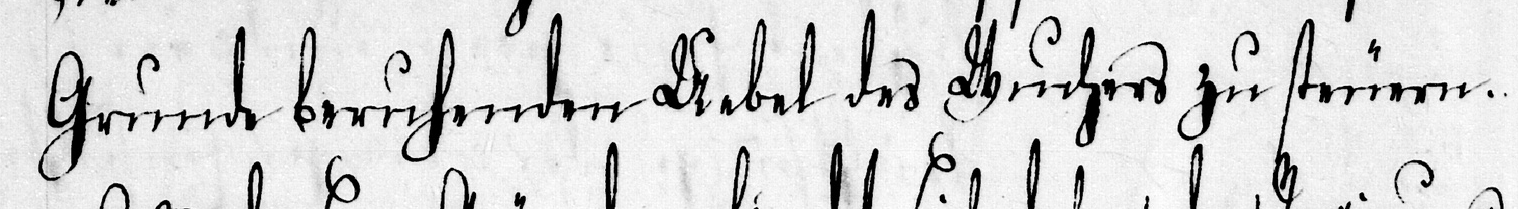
Grunde beruhenden Uebel des Wuchers zu steuern.
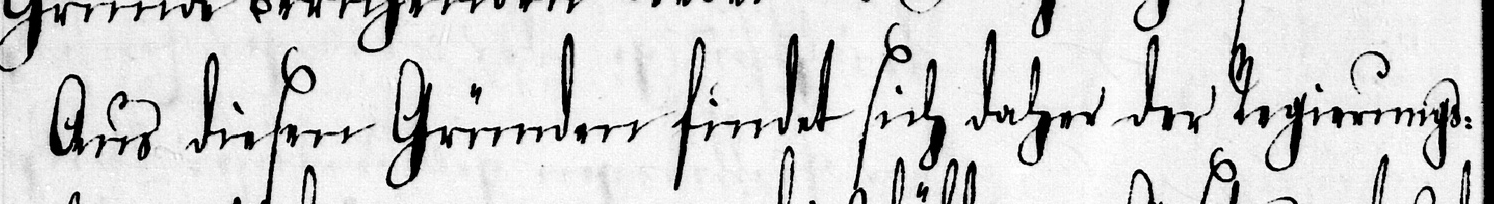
Aus diesen Gründen findet sich daher der Regierung¬
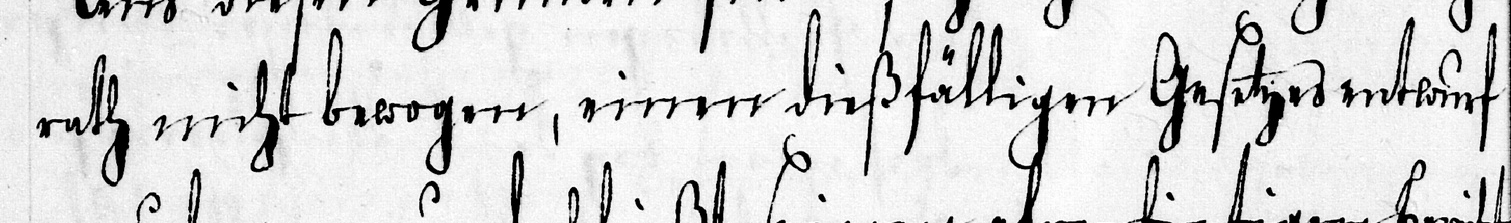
srath nicht bewogen, einen dießfälligen Gesetzesentwurf
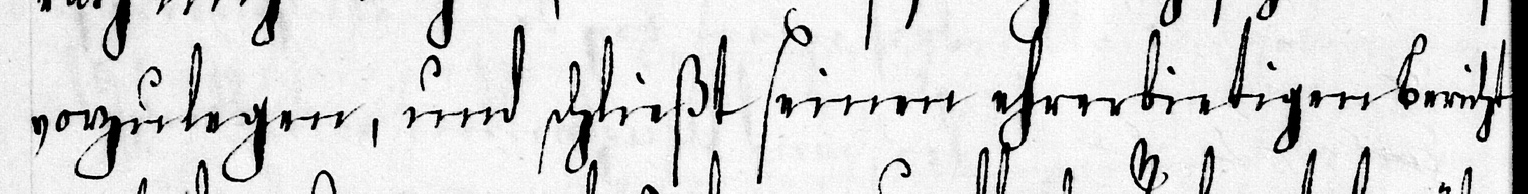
vorzulegen, und schließt seinen ehrerbietigen Beric¬
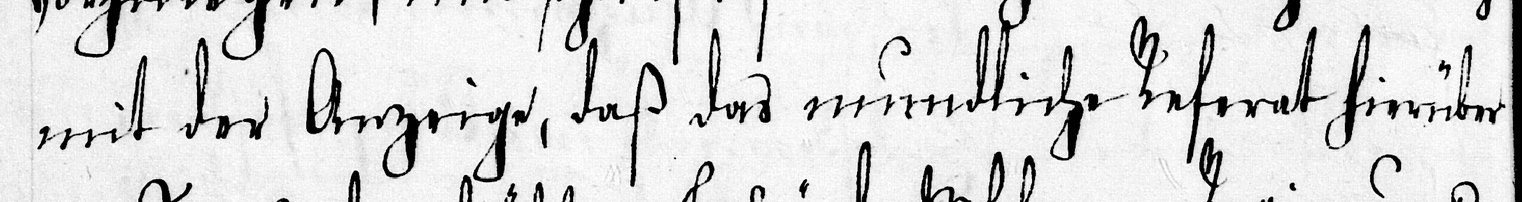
mit der Anzeige, daß das mundliche Referat hierüb¬
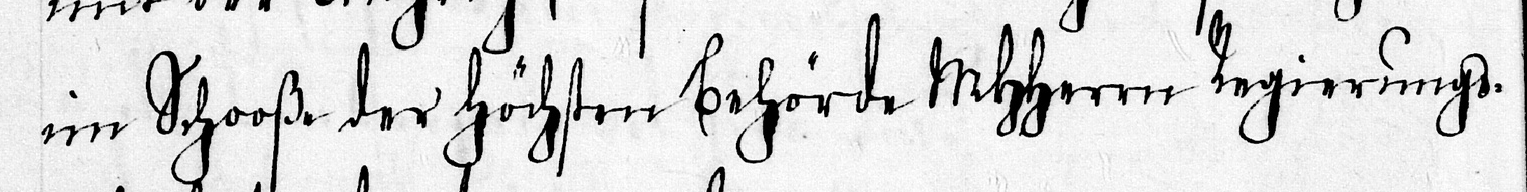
im Schooße der Höchsten Behörde MHHerrn Regierungs¬
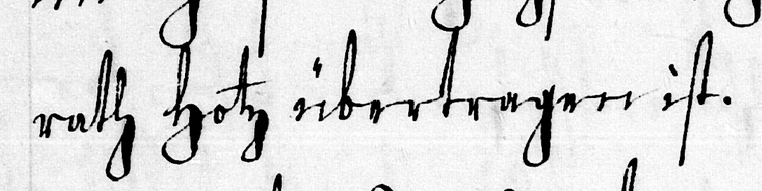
rath Hotz übertragen ist.
